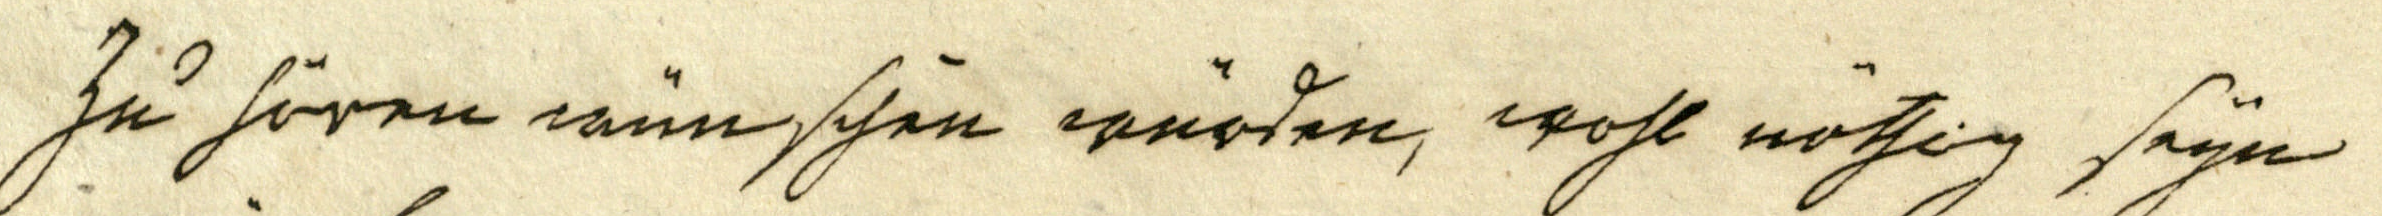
Zu hören wünschen würden, wohl nöthig seÿn
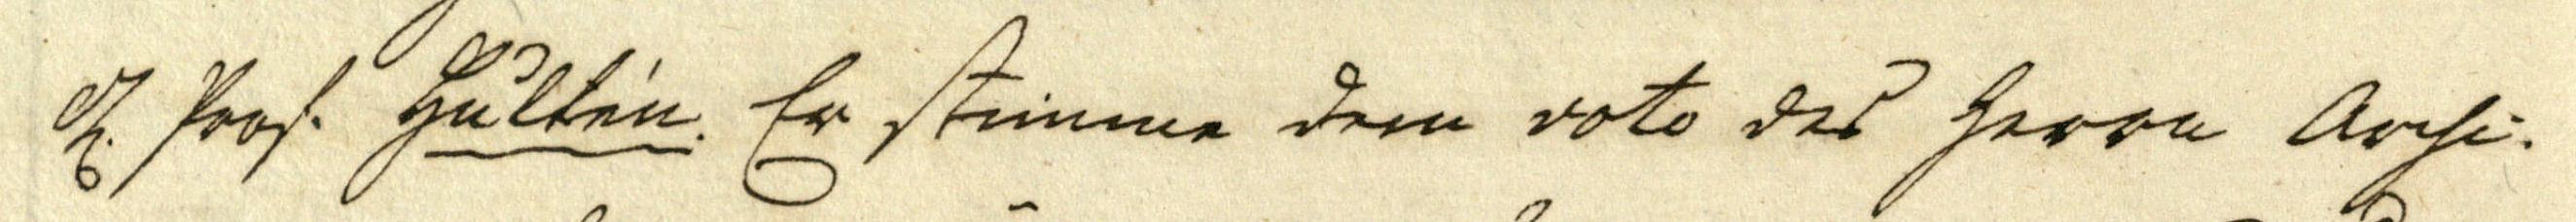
dh. Prof. Hultèn. Er stimme dem voto des herrn Archi¬
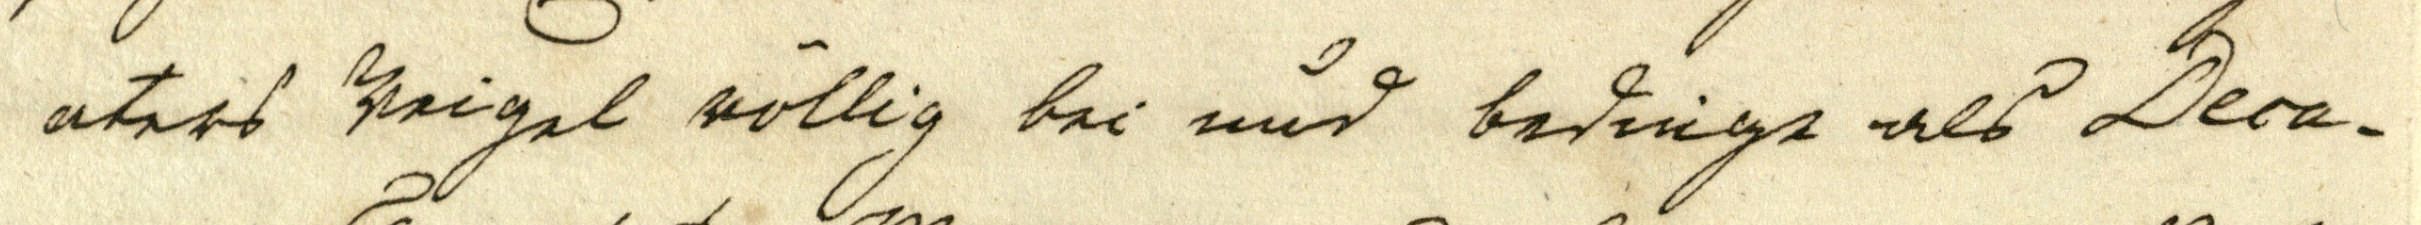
aters Weigel völlig bei und bedingt als Deca¬
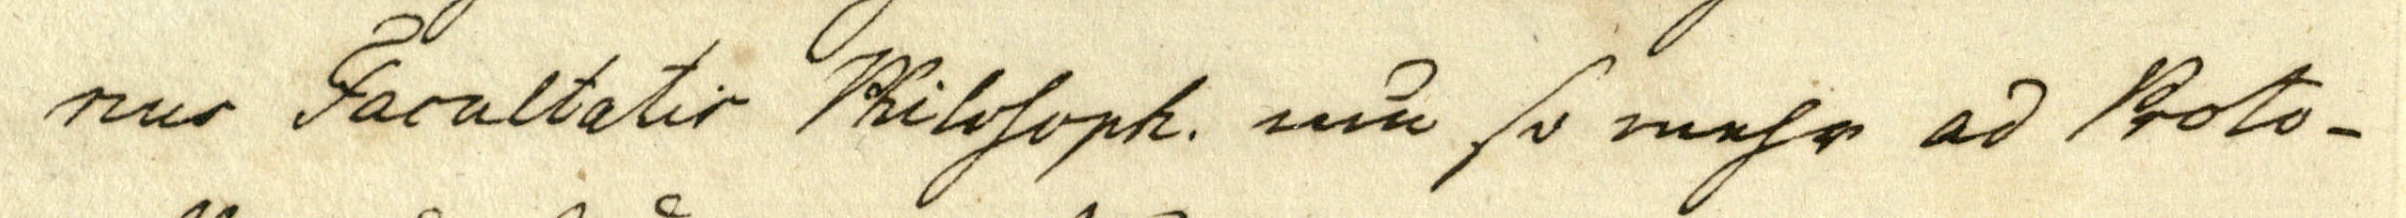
nus Facultatis Philosoph. um so mehr ad Proto¬
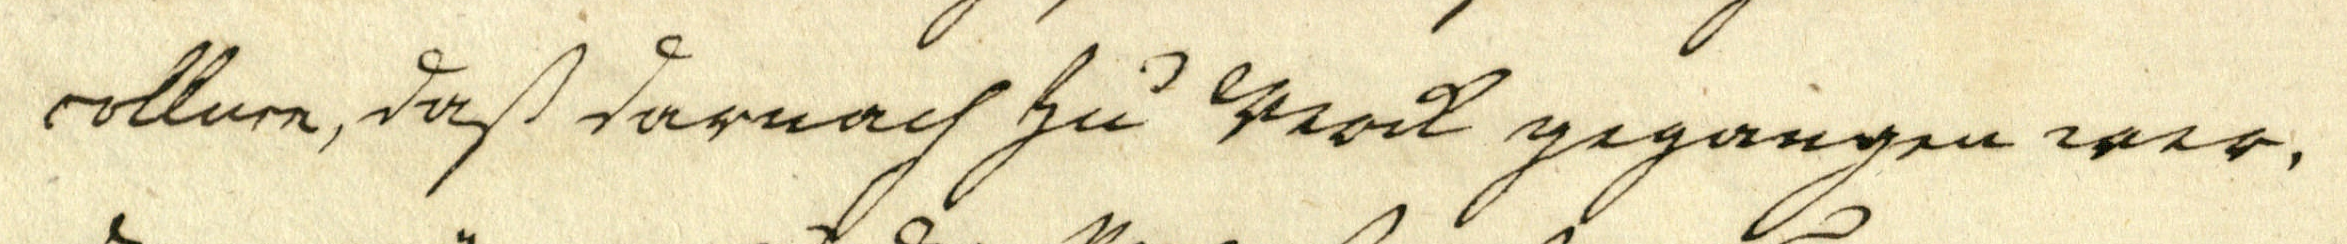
collum, daß darnach zu Werck gegangen wer¬
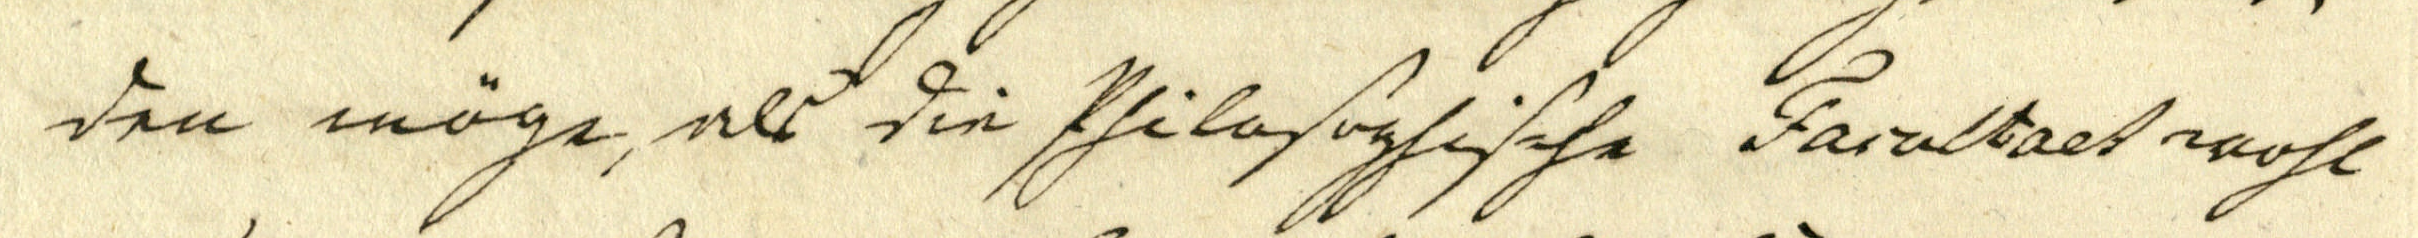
den möge, als die Philosophische Facultaet wohl
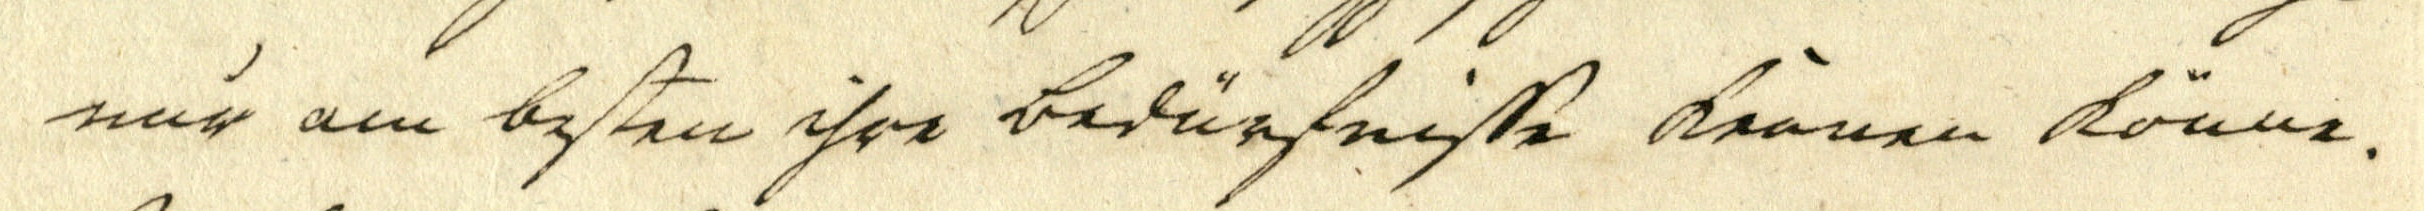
nur am besten ihre Bedürfnisse kennen könne.
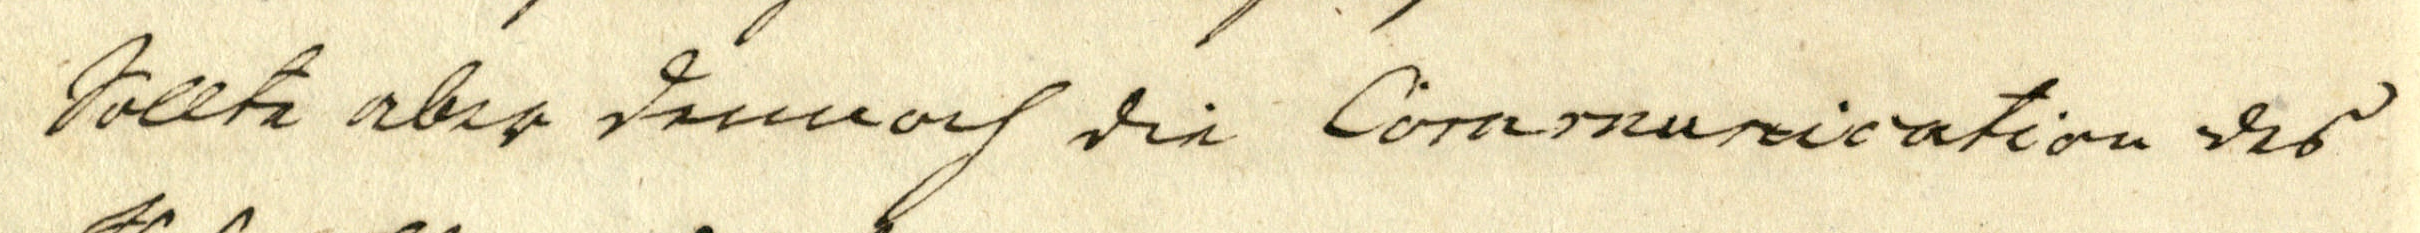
Sollte aber dennoch die Communication des
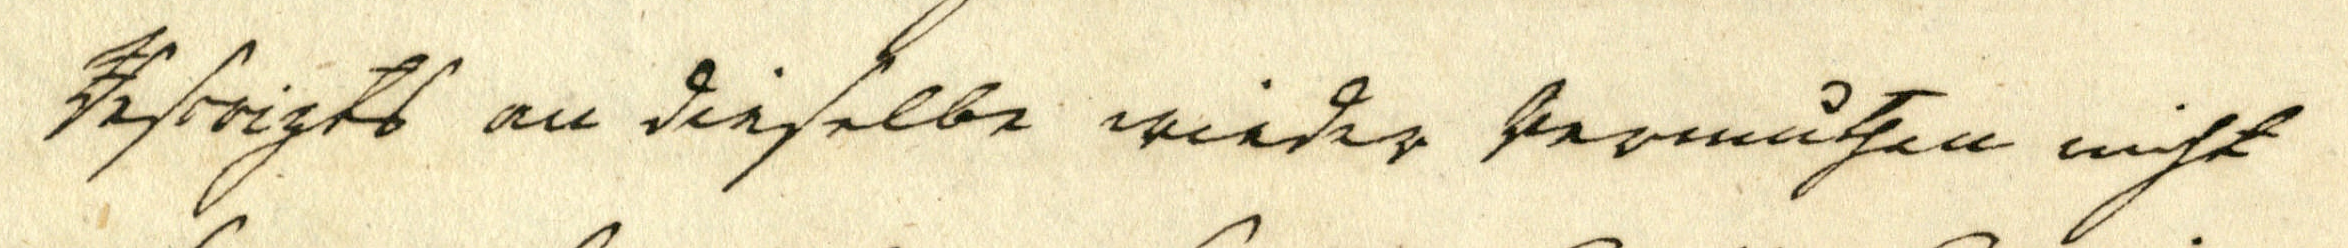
Rescripts an dieselbe wieder Vermuthen nicht
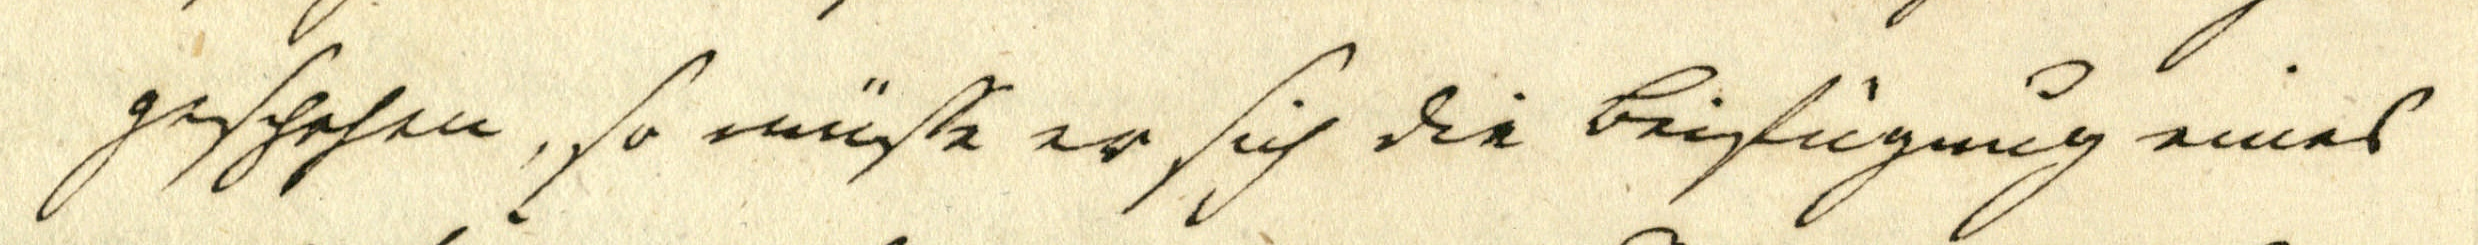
geschehen, so müsse er sich die Beifügung eines
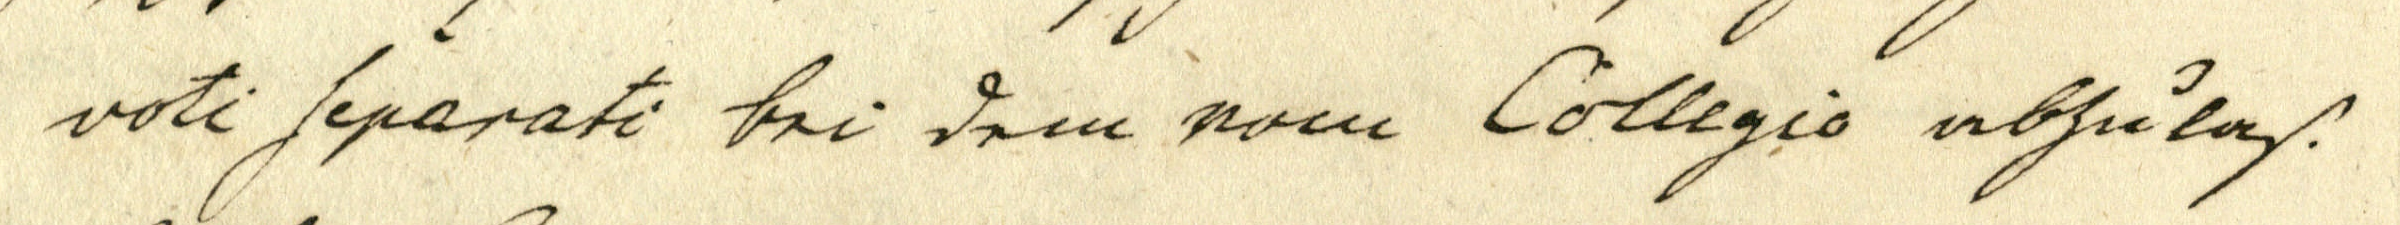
voti separati bei dem vom Collegio abzulas¬
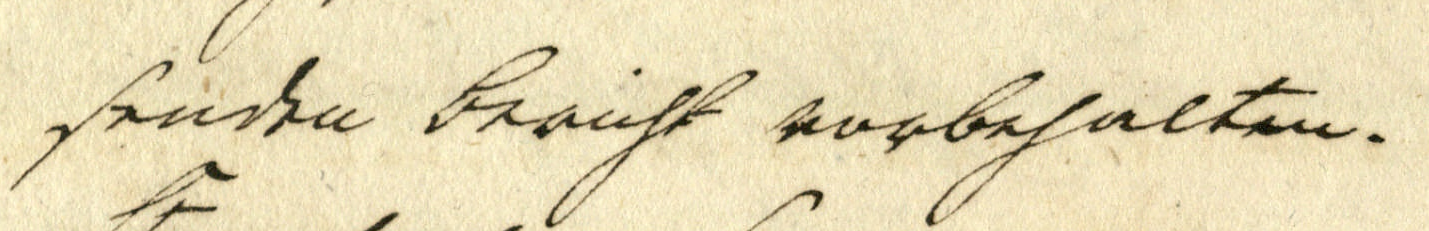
senden Bericht vorbehalten.
